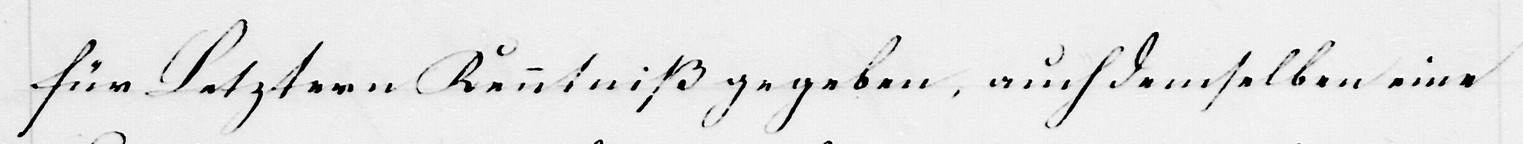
für Letztern Kenntniß gegeben, auch demselben eine
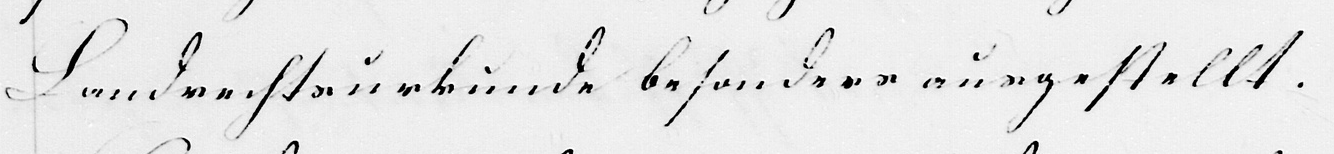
Landrechtsurkunde besonders ausgestellt.
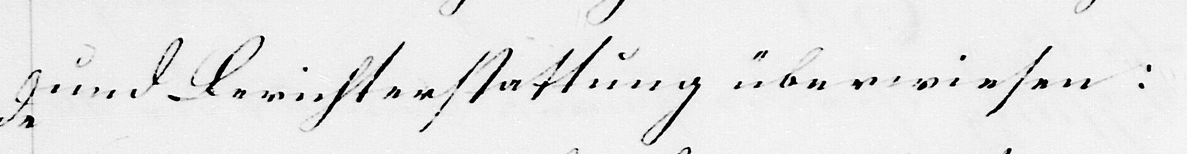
und Berichterstattung überwiesen:
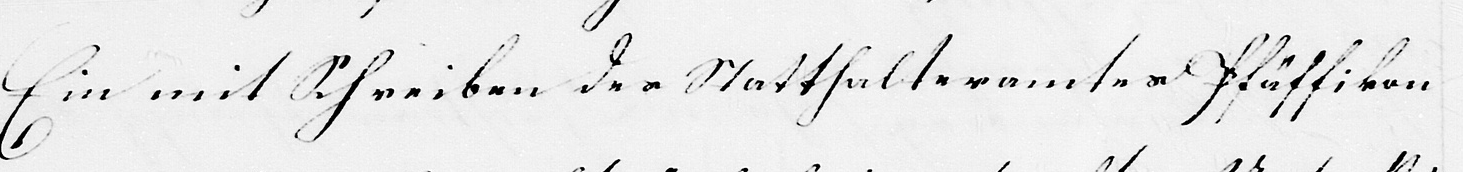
Ein mit Schreiben des Statthalteramtes Pfäffikon
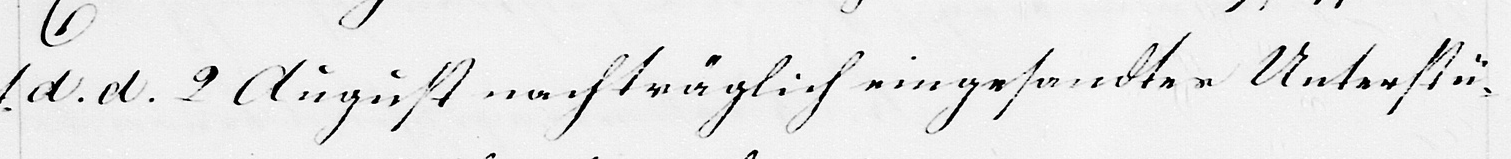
d. d. 2 August nachträglich eingesandtes Unterstü¬
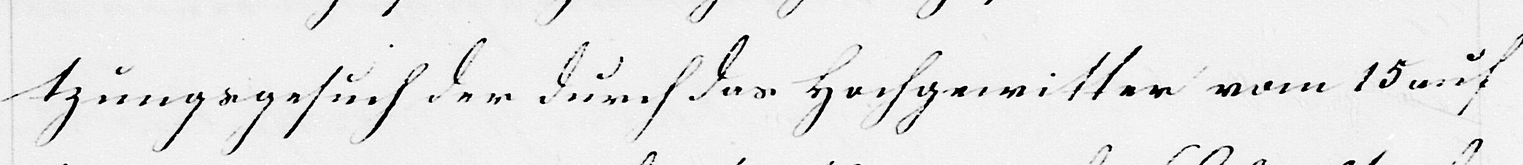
tzungsgesuch der durch das Hochgewitter vom 15 auf
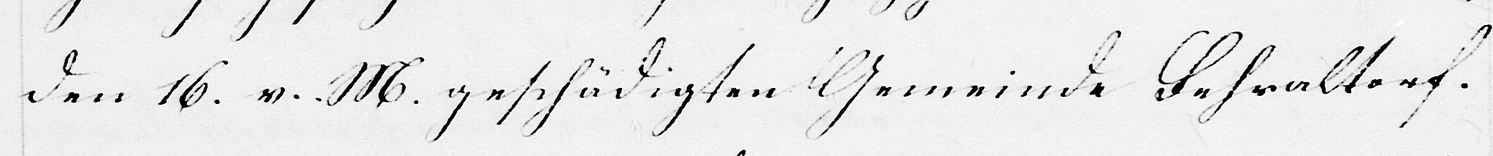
den 16. v. M. geschädigten Gemeinde Fehraltorf.
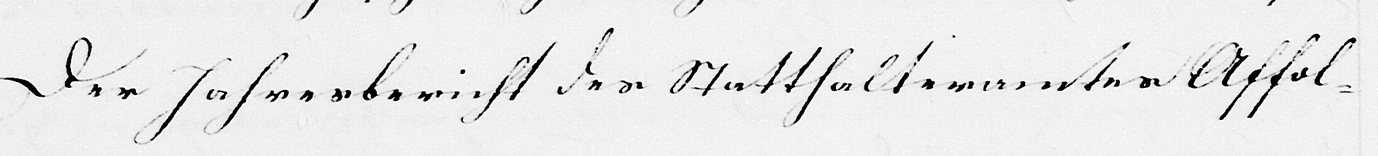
Der Jahresbericht des Statthalteramtes Affol¬
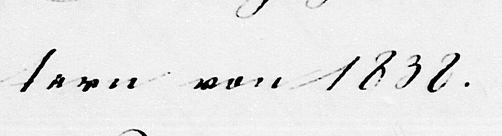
tern von 1838.
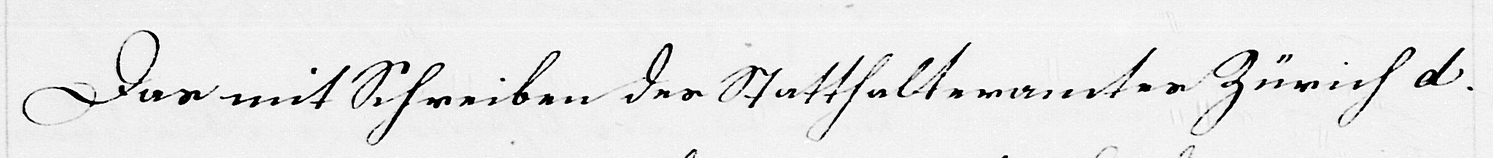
Das mit Schreiben des Statthalteramtes Zürich d.
